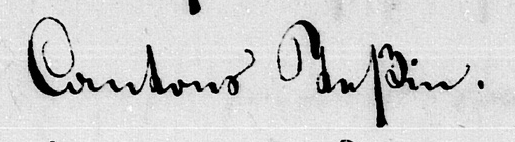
Cantons Teßin.
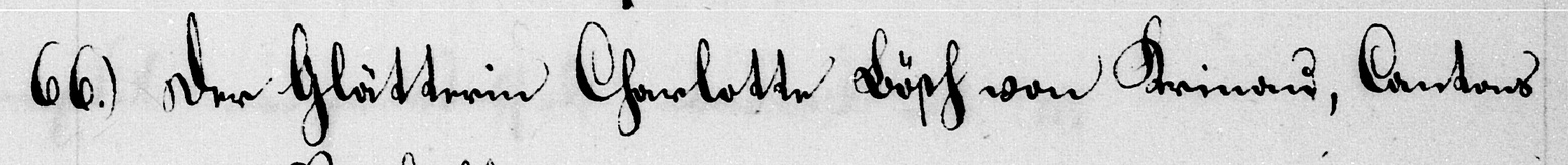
66.) Der Glätterin Charlotte Bösch von Krinau, Cantons
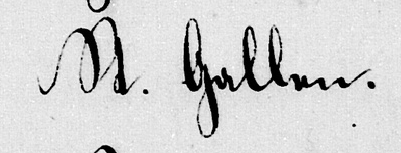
St. Gallen.
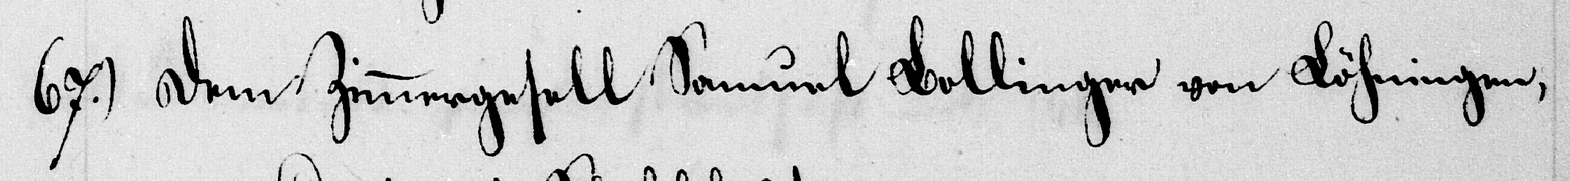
67.) Dem Zimmergesell Samuel Bollinger von Löhningen,
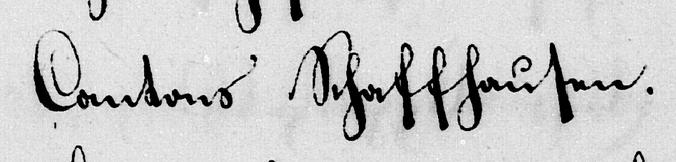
Cantons Schaffhausen.
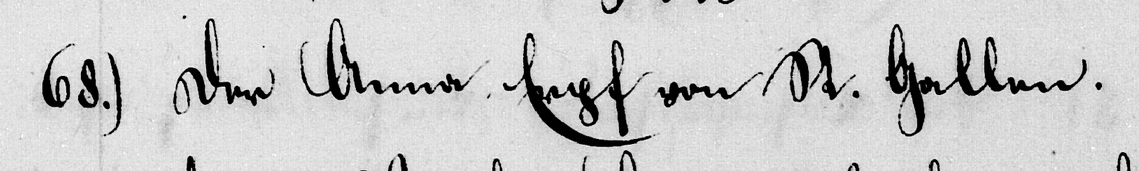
68.) Der Anna Erpf von St. Gallen.
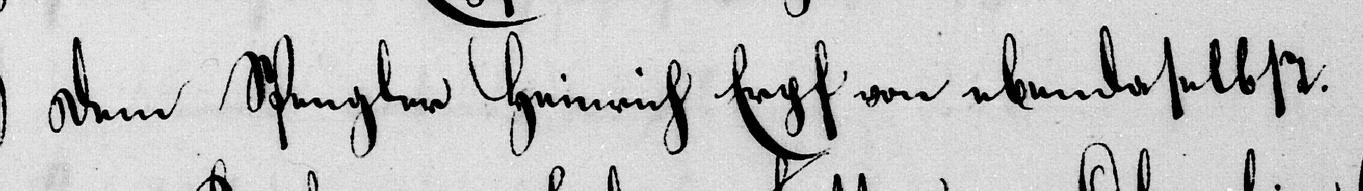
Dem Spengler Heinrich Erpf von ebendaselbst.
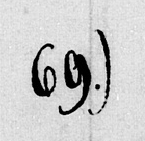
69.)
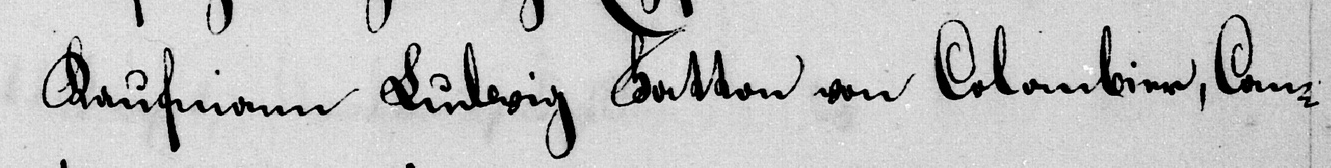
Kaufmann Ludwig Fatton von Colombier, Can¬
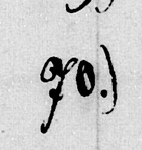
70.)
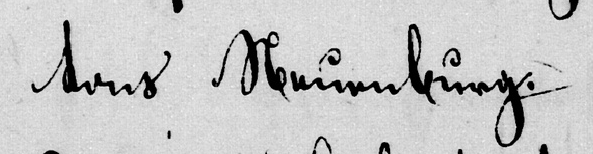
tons Neuenburg.
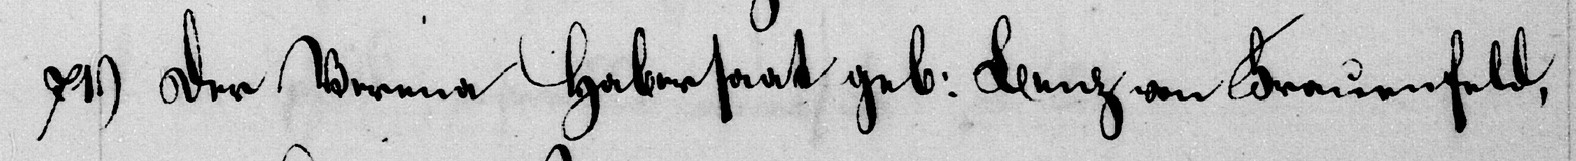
71.) Der Verena Habersaat geb: Benz von Frauenfeld,
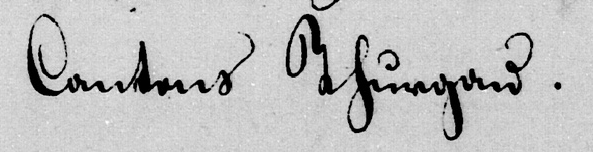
Cantons Thurgau.
